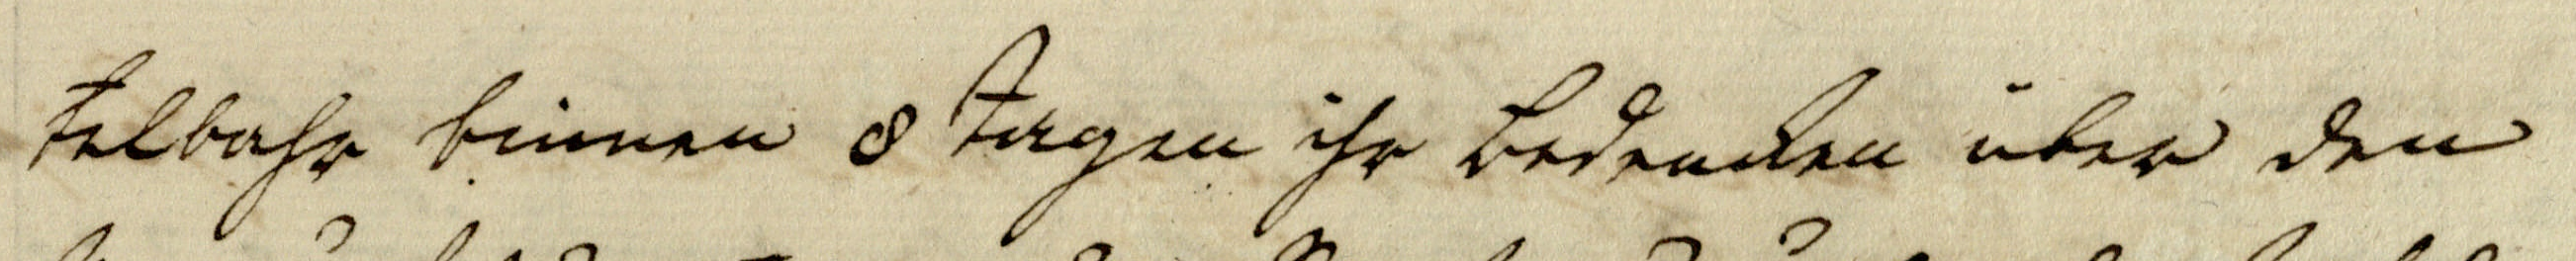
telbahr binnen 8 Tagen ihr Bedencken über den
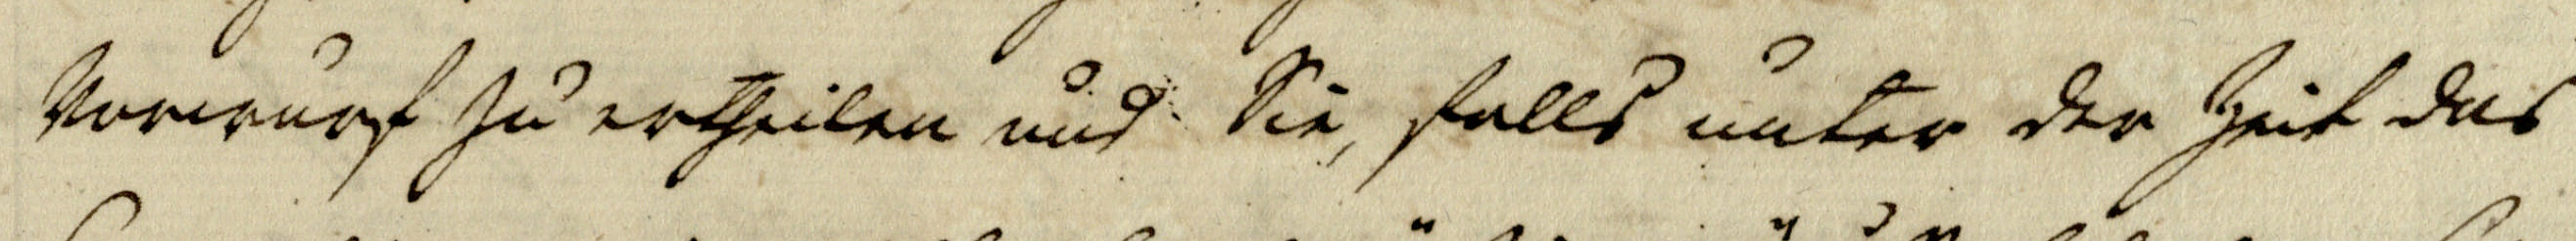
Vorwurf zu ertheilen und Sie, falls unter der Zeit das
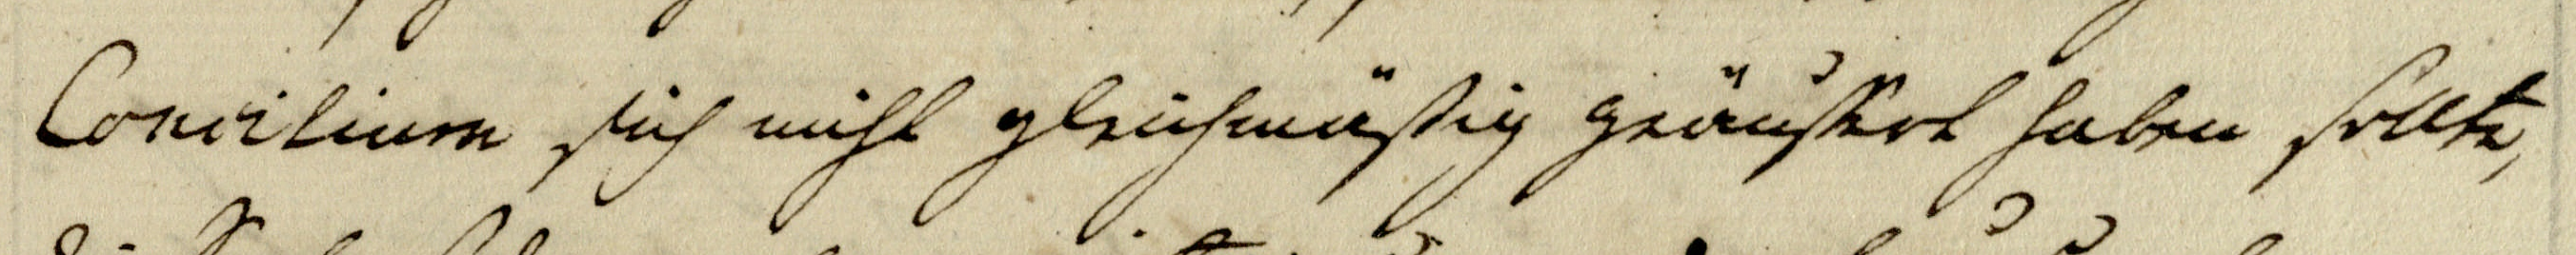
Concilium sich nicht gleichmäßig geäussert haben sollte,
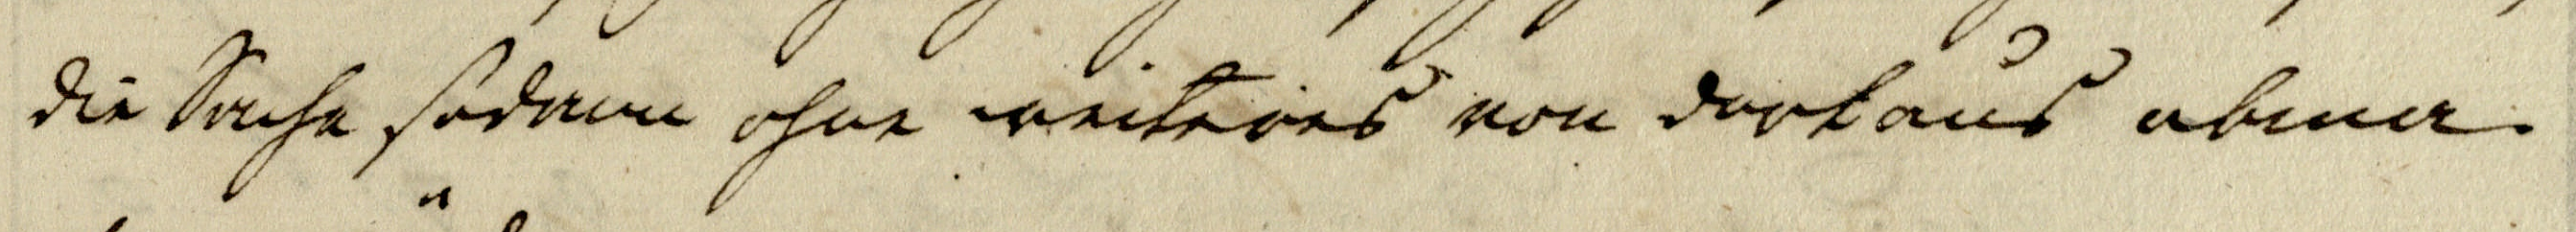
die Sache sodann ohne weiteres von dortaus abma¬
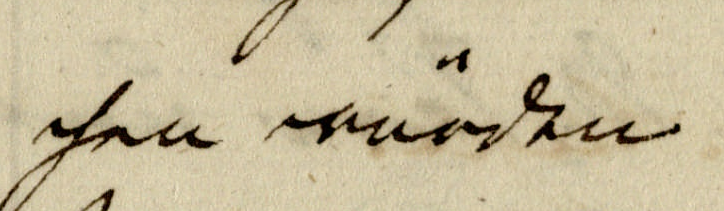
chen würden.
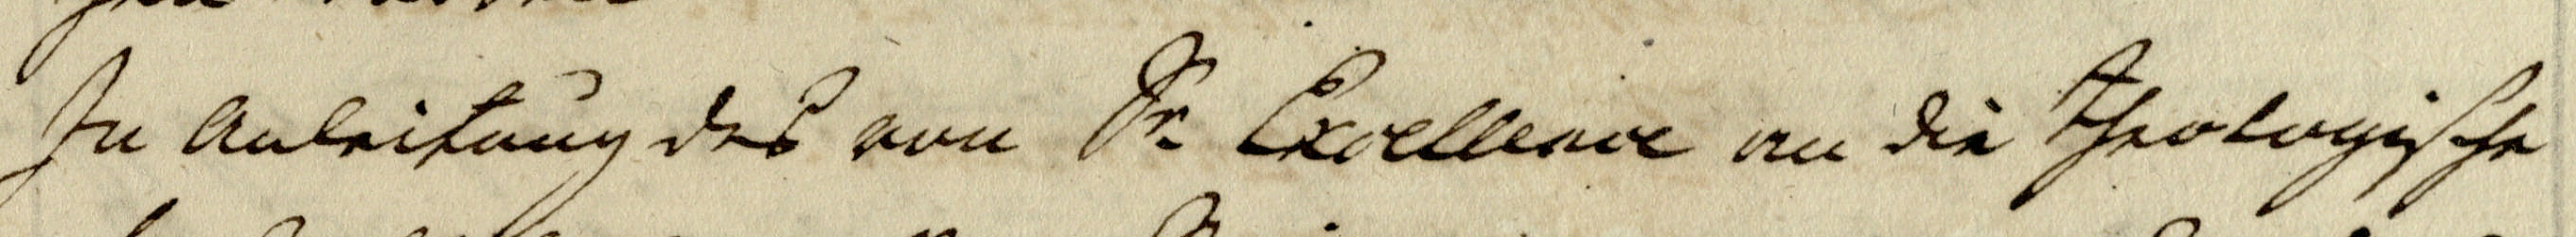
In Anleitung des von Sr Excellence an die Theologische
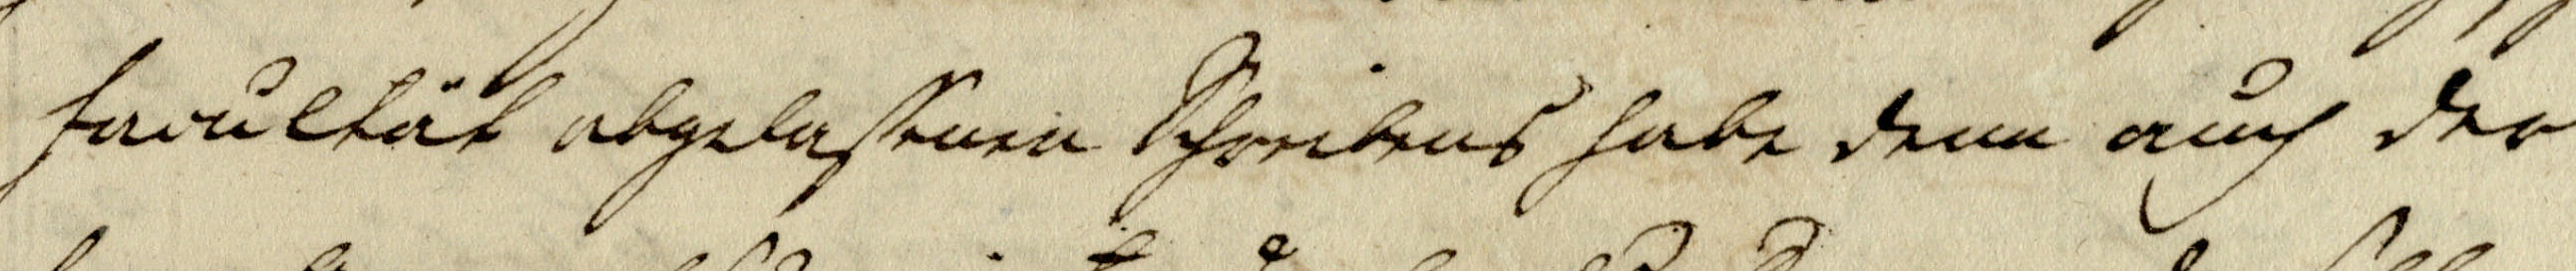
Facultät abgelassenen Schreibens habe dem auch der
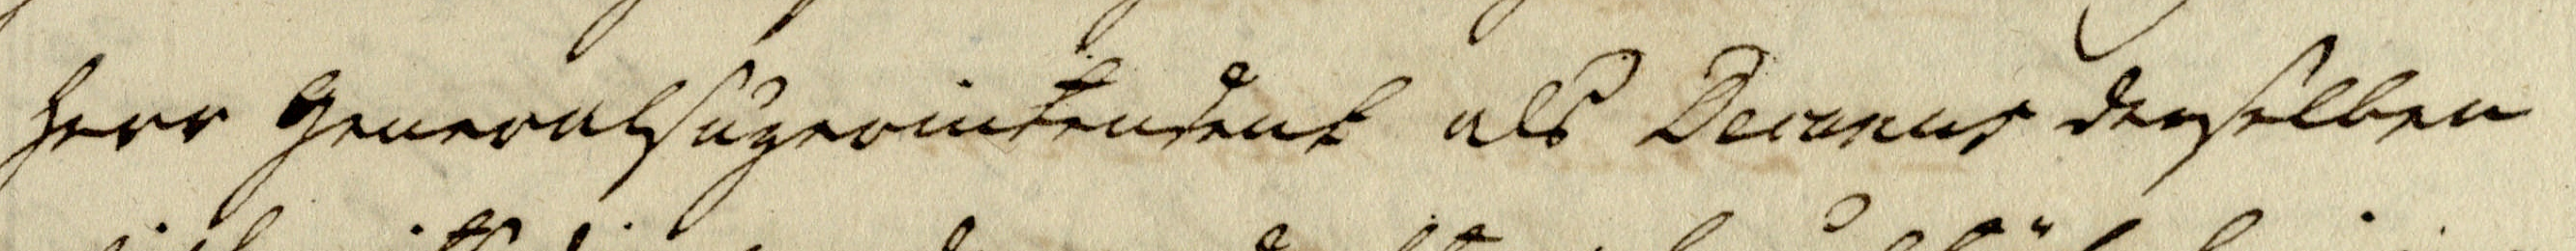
Herr Generalsuperintendent als Decanus derselben
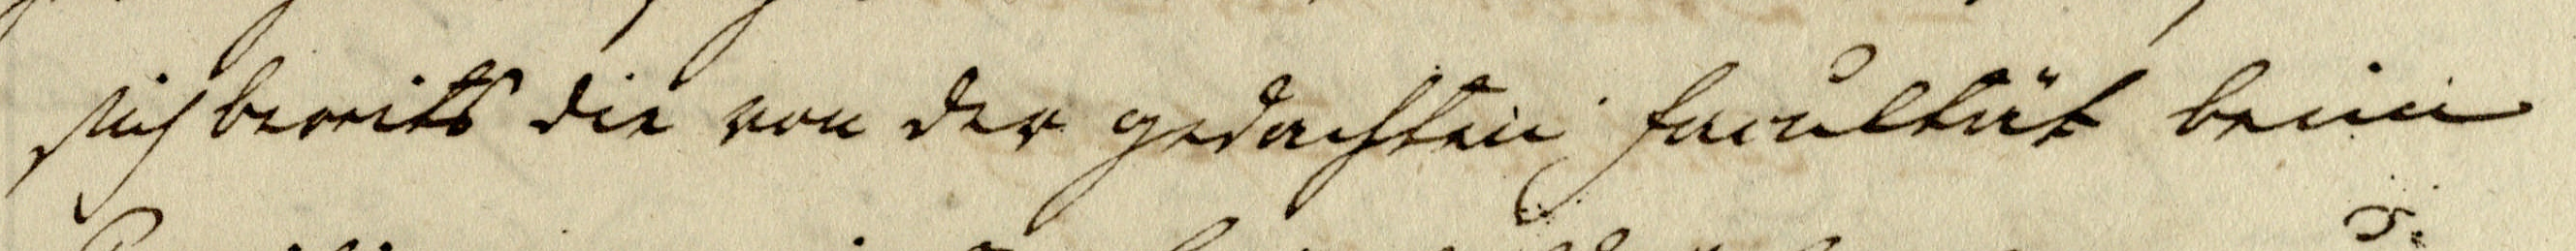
sich bereits die von der gedachten Facultät beim
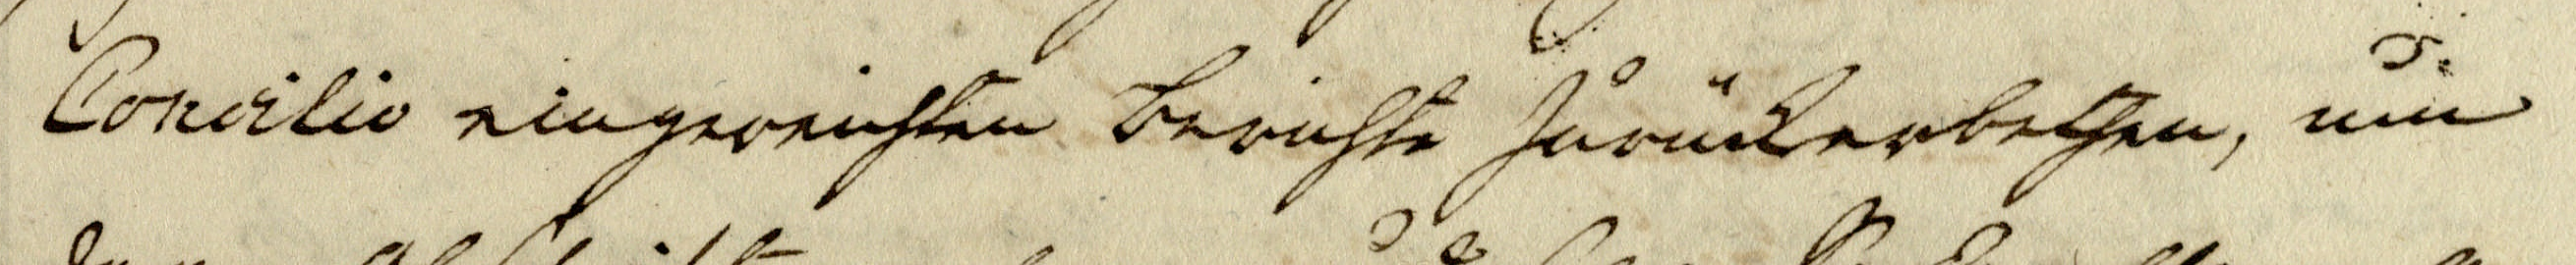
Concilio eingereichten Berichte zurückerbethen, um
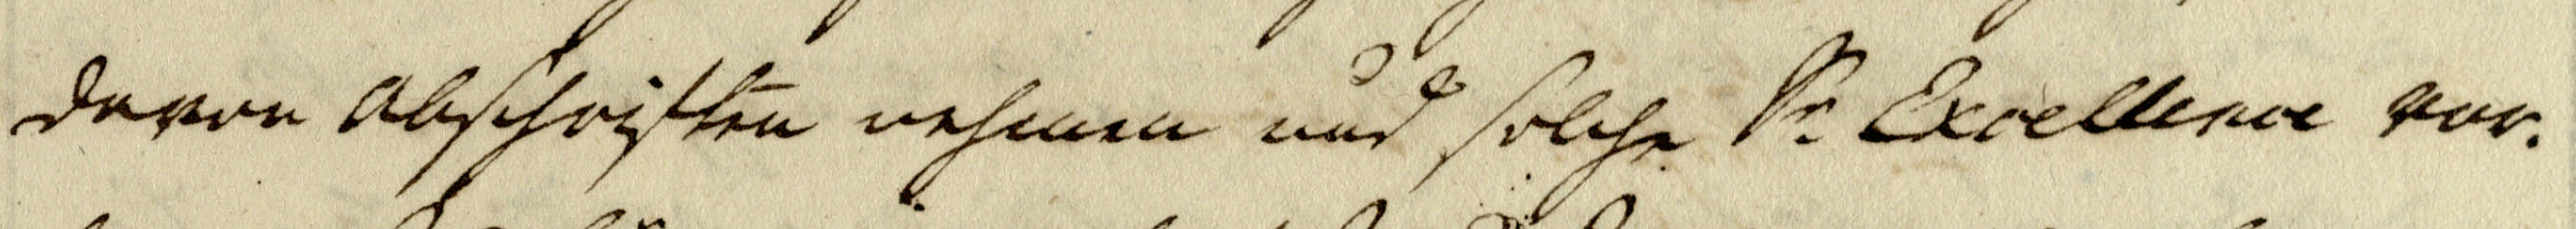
davon Abschriften nehmen und solche Sr Excellence vor¬
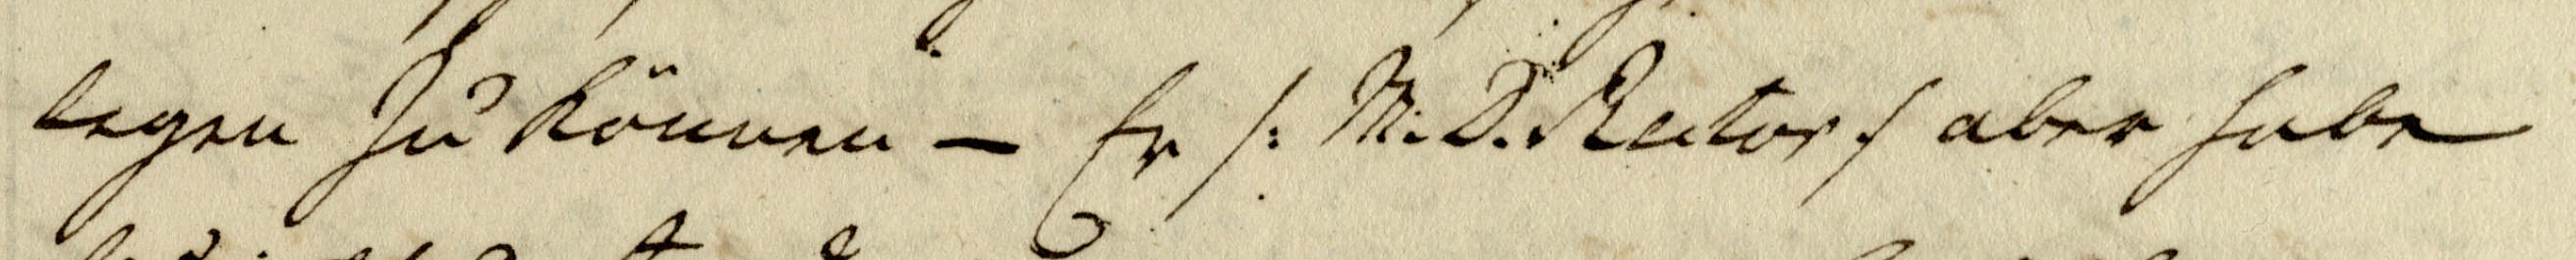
legen zu können Er /. M. D. Rector ./ aber habe
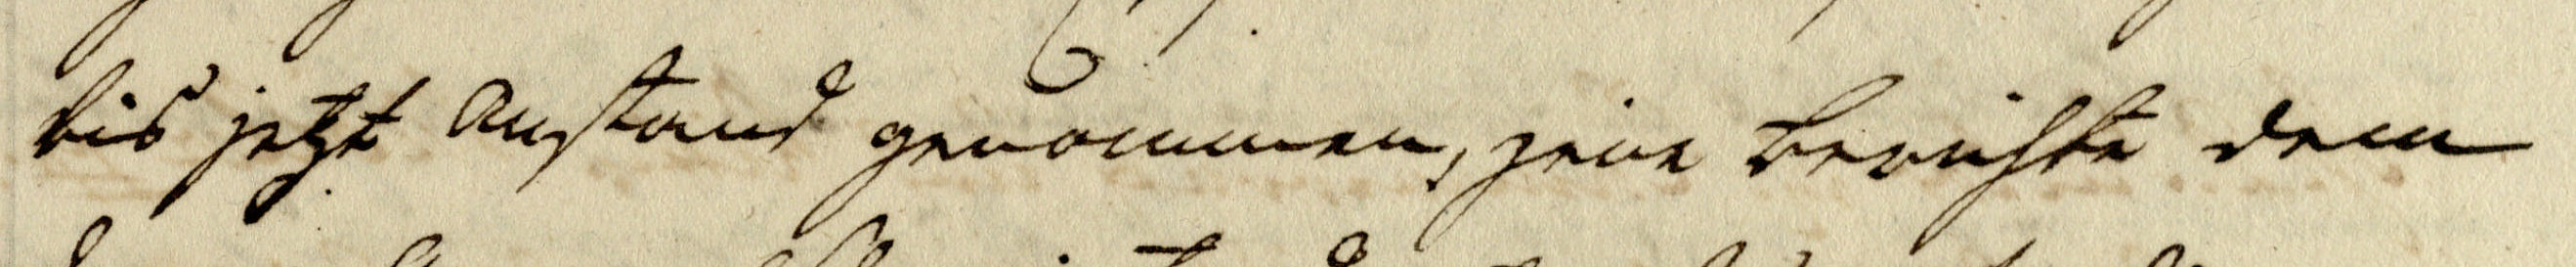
bis jetzt Anstand genommen, jene Berichte dem
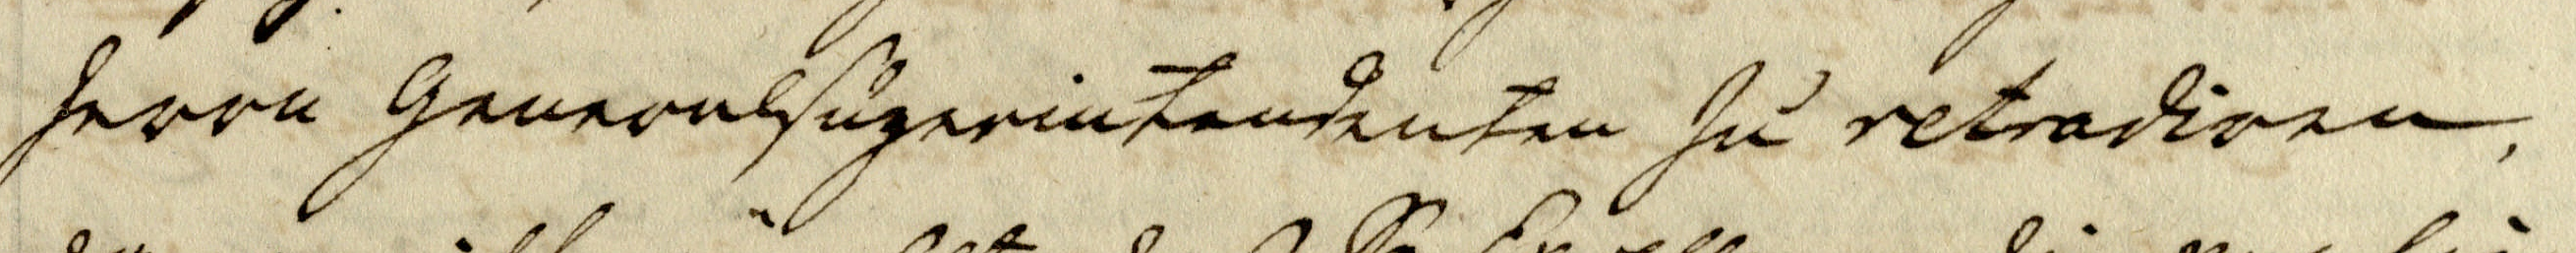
Herrn Generalsuperintendenten zu retradiren,
